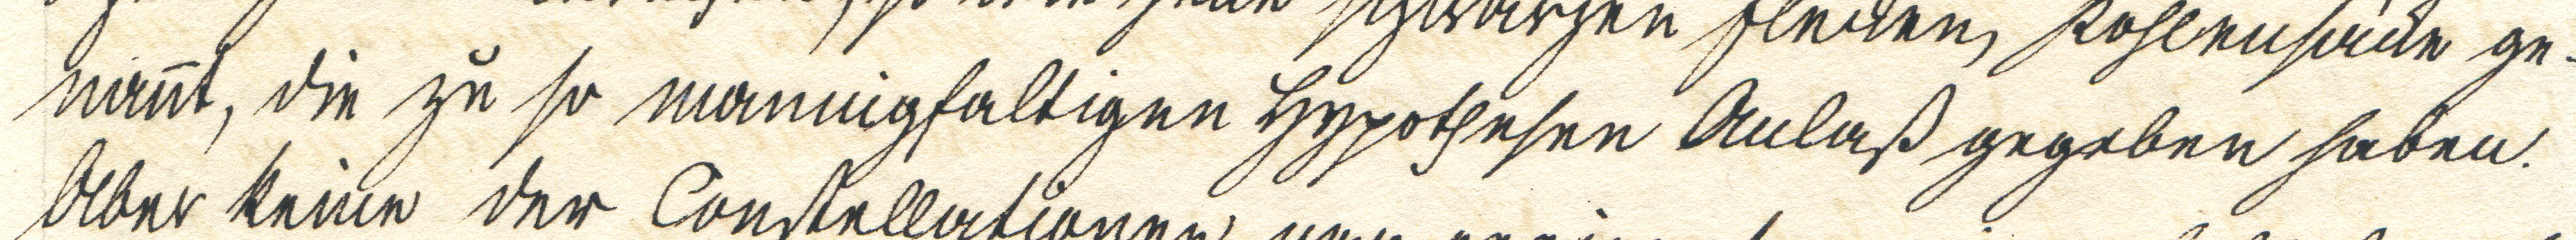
nañt, die zu so mannigfaltigen Hypothesen Anlaß gegeben haben.
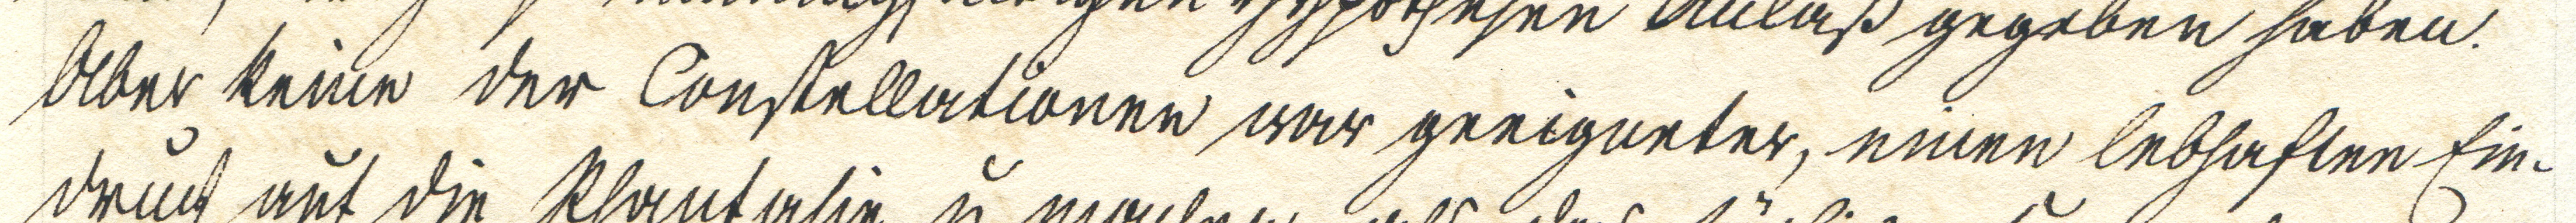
Aber keine der Constellationen war geeigneter, einen lebhaften Ein-
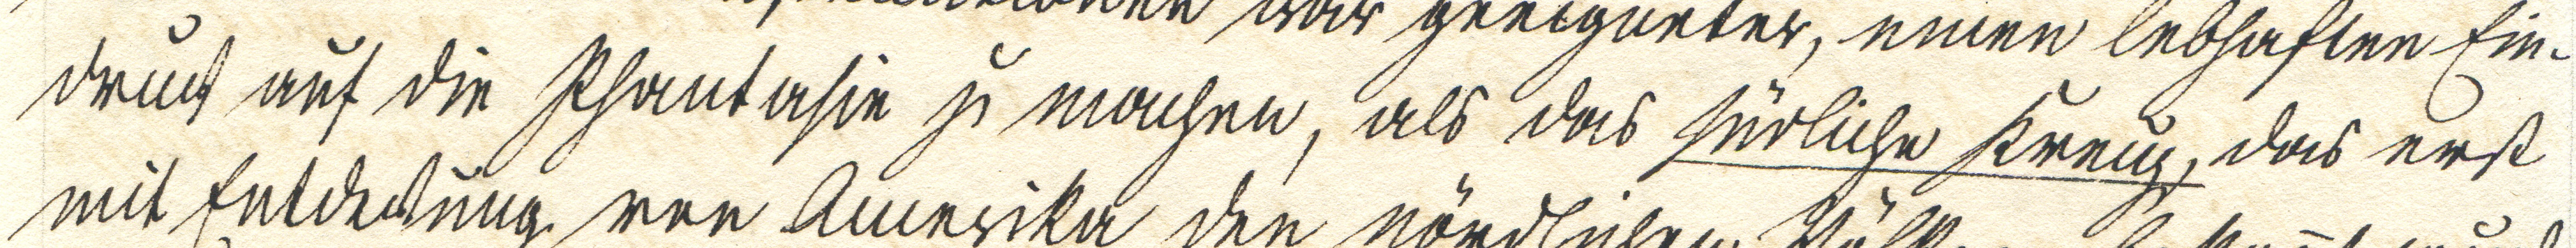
druck auf die Phantasie zu machen, als das südliche Kreuz, das erst
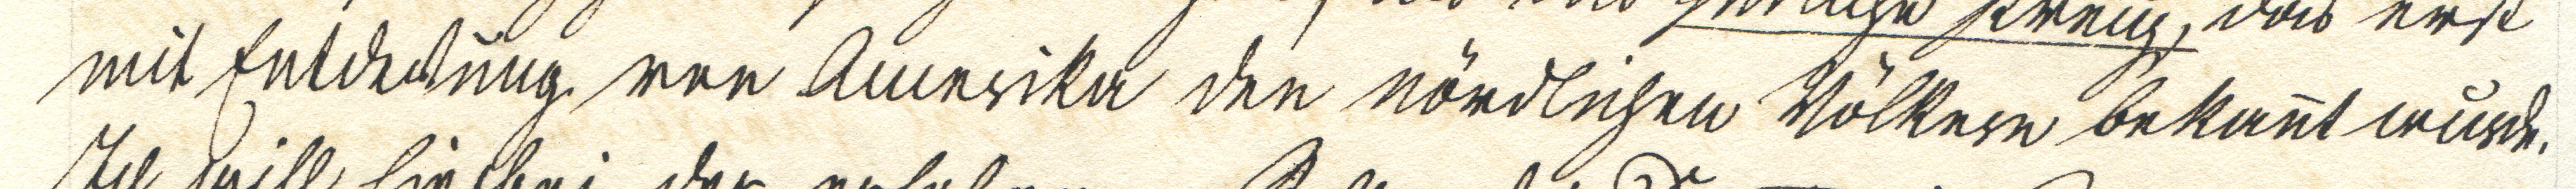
mit Entdeckung von Amerika den nördlichen Völkern bekañt wurde.
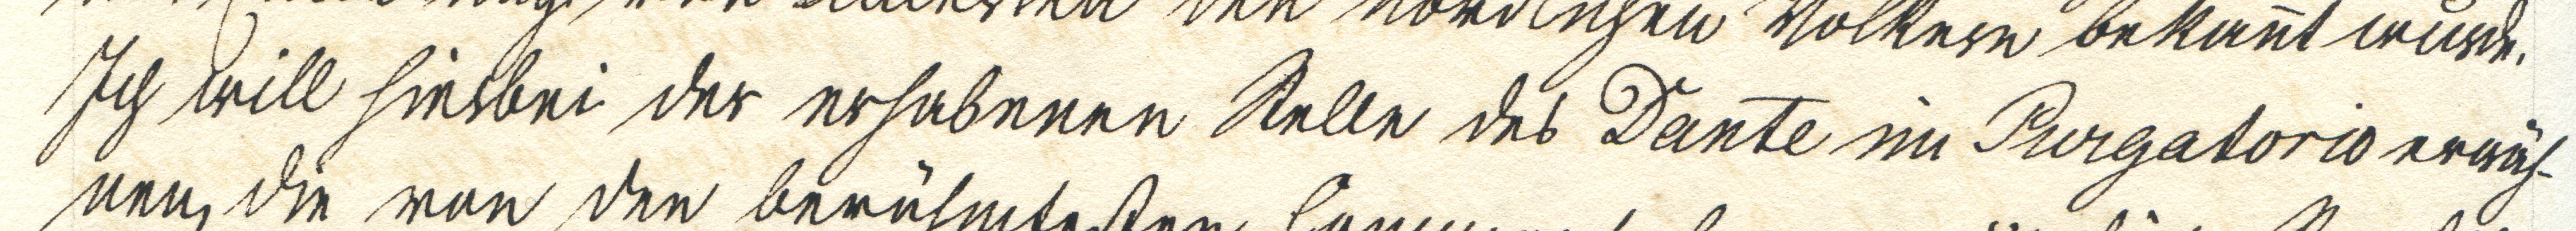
Ich will hierbei der erhabenen Stelle des Dante im Purgatorio erwäh-
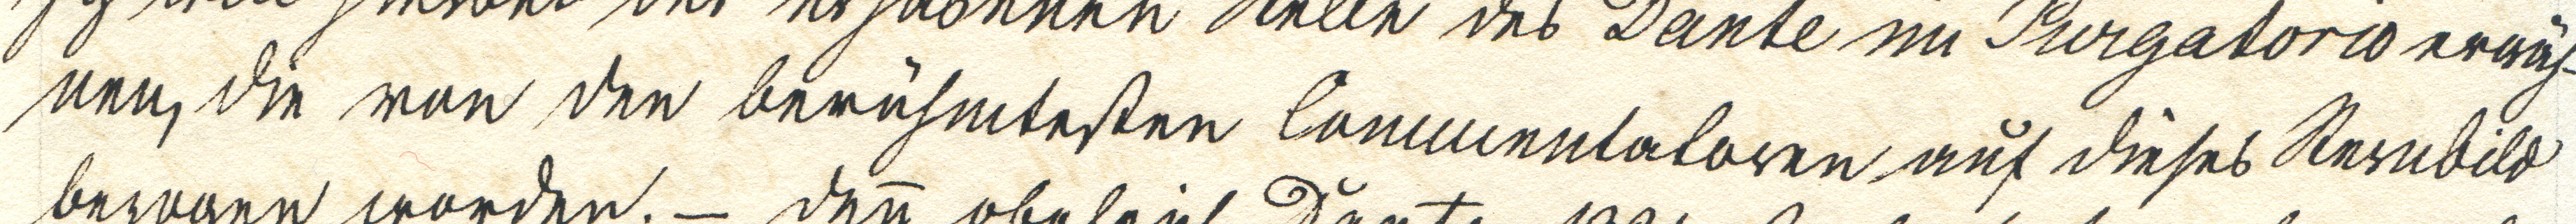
nen, die von den berühmtesten Commentatoren auf dieses Sternbild
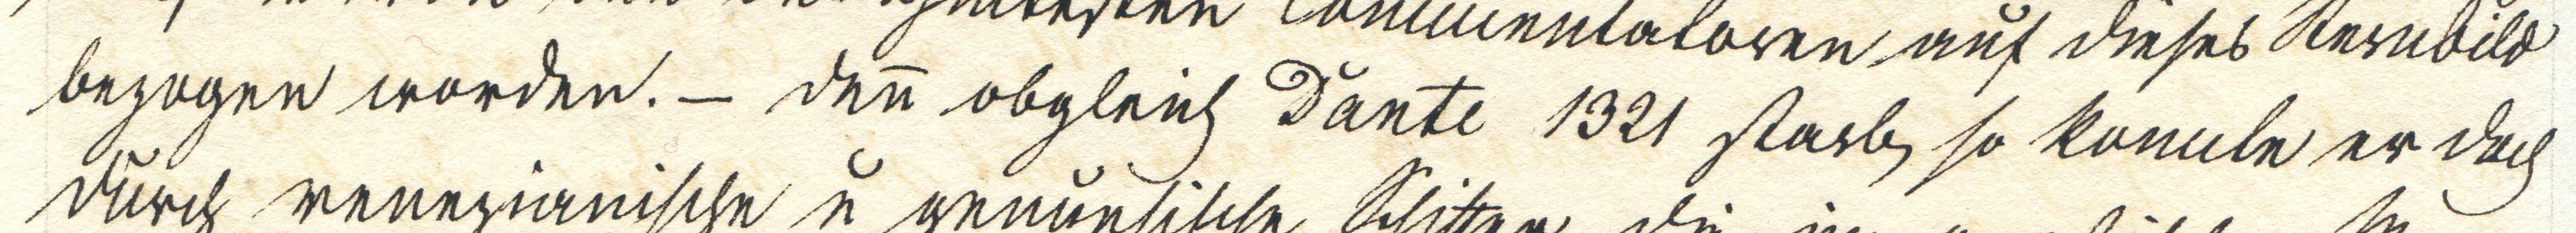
bezogen worden. – deñ obgleich Dante 1321 starb, so konnte er doch
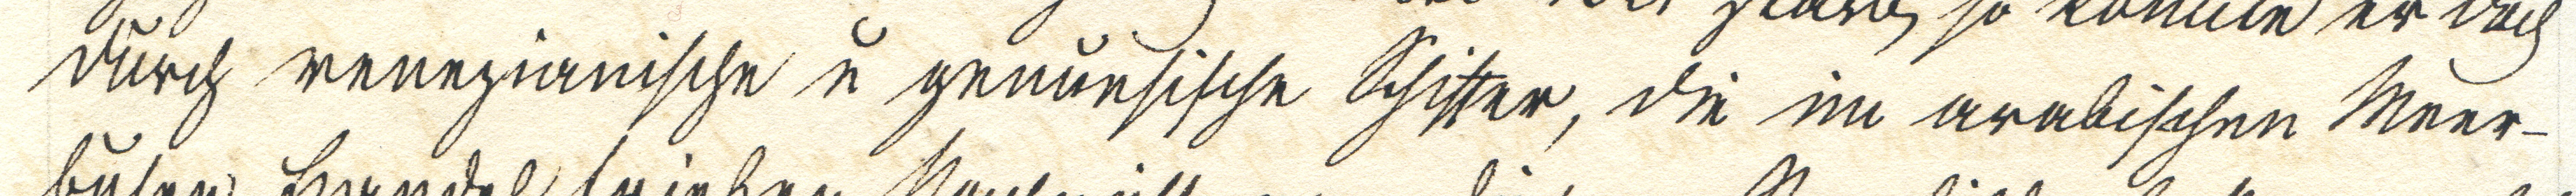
durch venezianische u genuesische Schiffer, die im arabischen Meer-
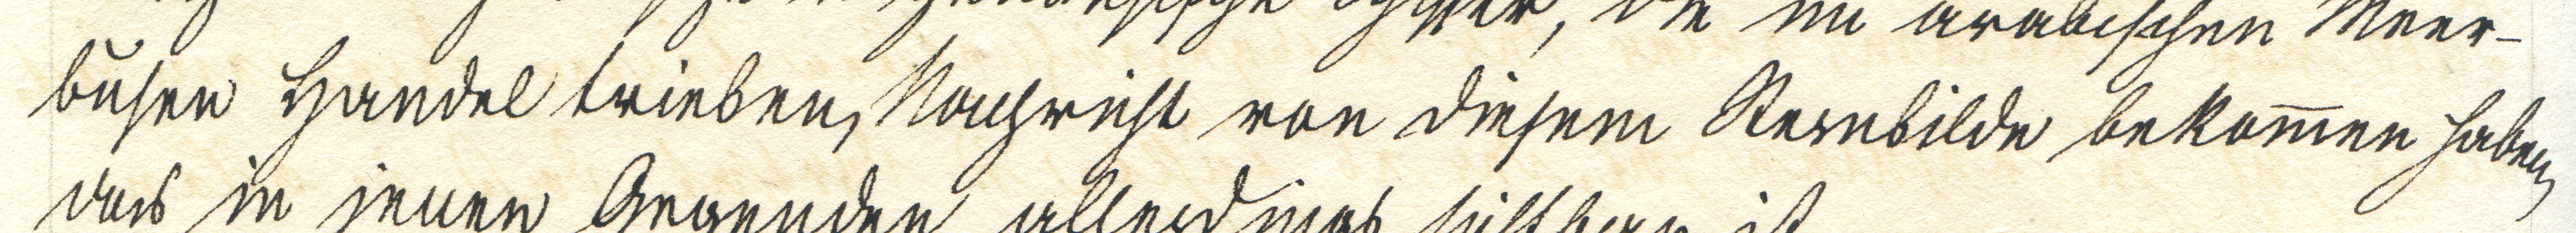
busen Handel trieben, Nachricht von diesem Sternbilde bekom̃en haben,
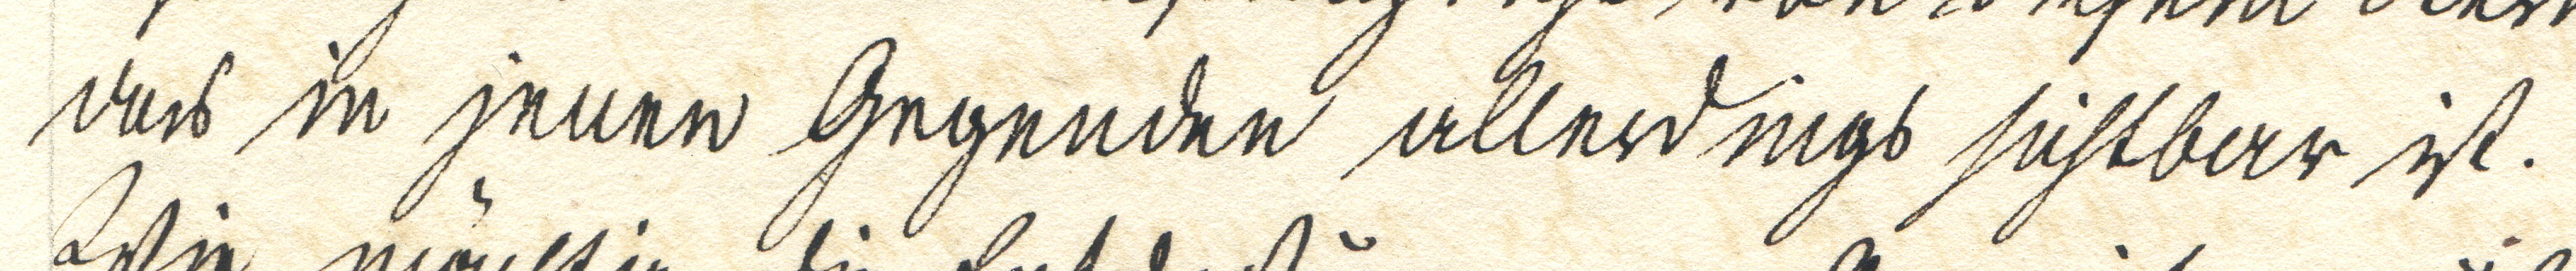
das in jenen Gegenden allerdings sichtbar ist.
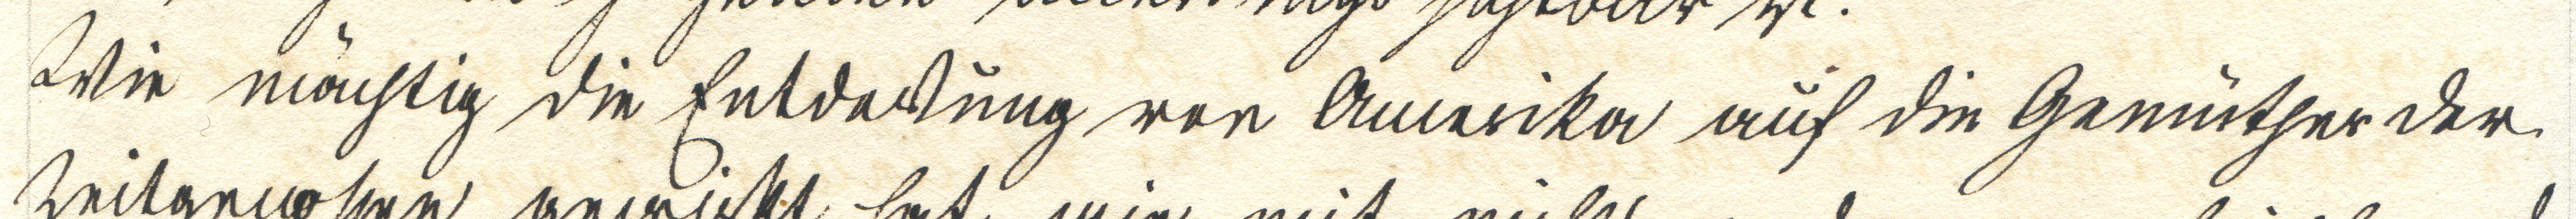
Wie mächtig die Entdeckung von Amerika auf die Gemüther der
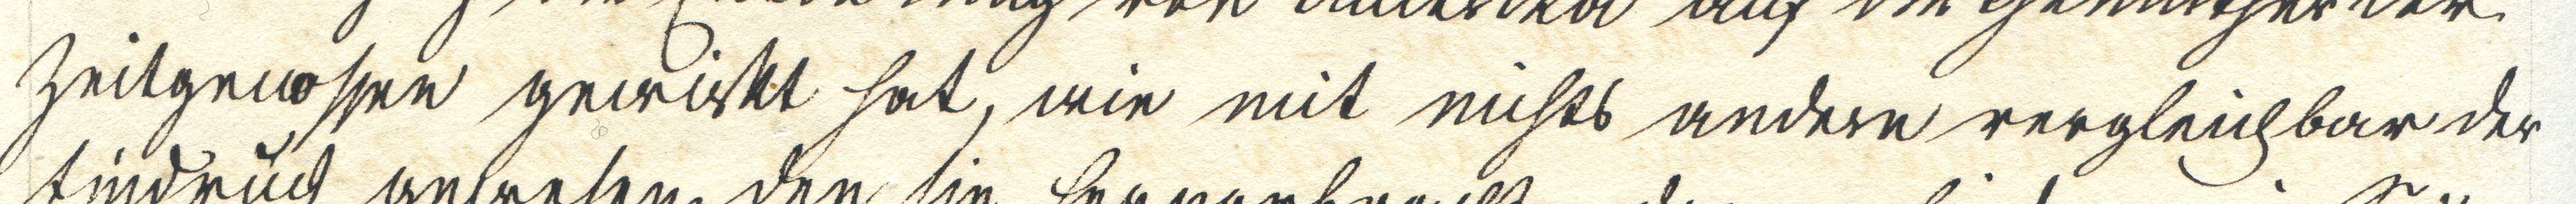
Zeitgenossen gewirkt hat, wie mit nichts vergleichbar der
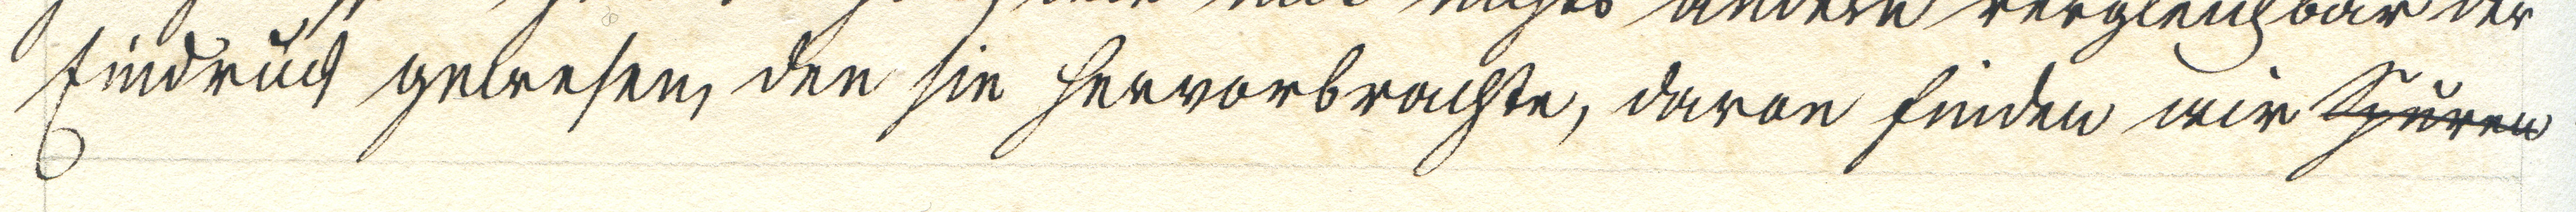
Eindruck gewesen, den sie hervorbrachte, davon finden wir Spuren
